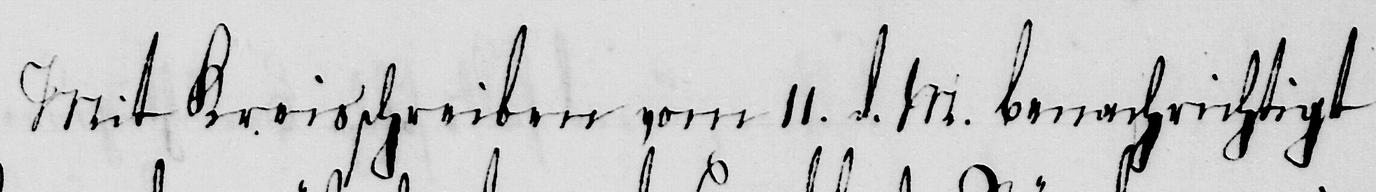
Mit Kreisschreiben vom 11. d. M. benachrichtigt
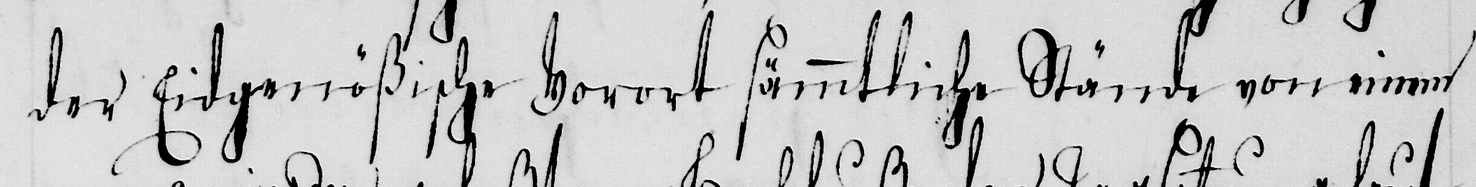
der Eidgenößische Vorort sämmtliche Stände von einem
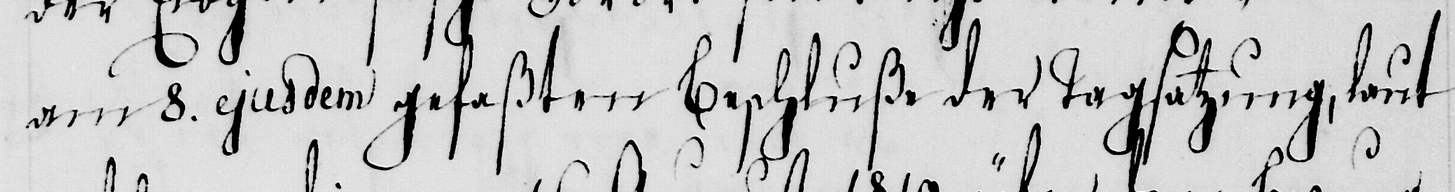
am 8. ejusdem gefaßten Beschluße der Tagsatzung, laut
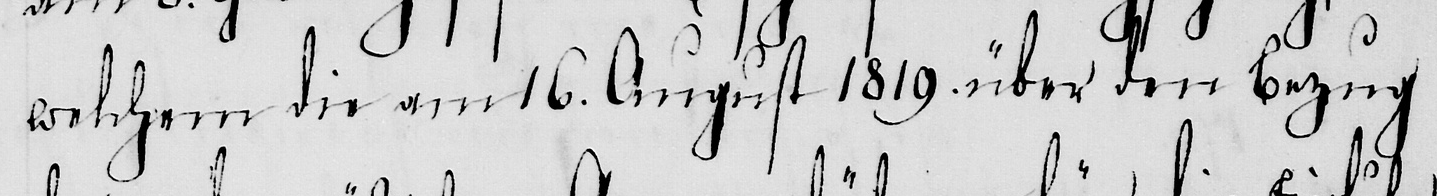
welchem die am 16. August 1819. über den Bezug
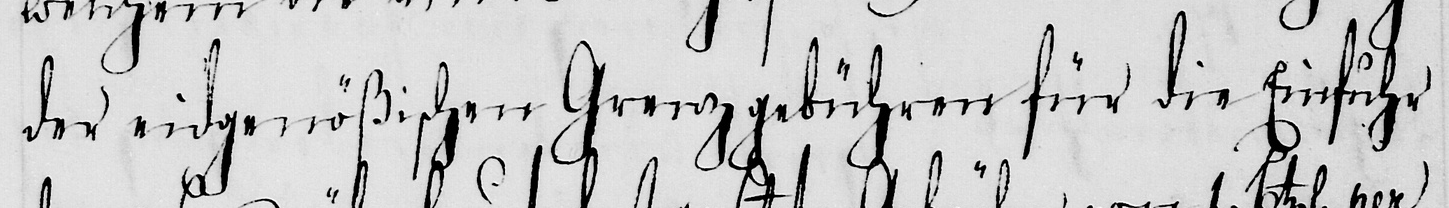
der eidgenößischen Grenzgebühren für die Einfuhr
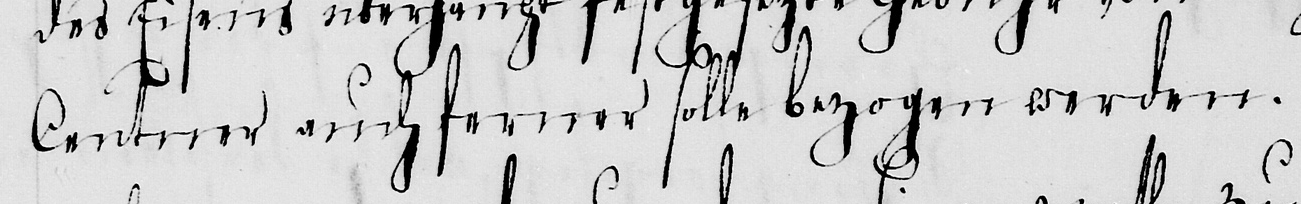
Centner auch ferner solle bezogen werden.
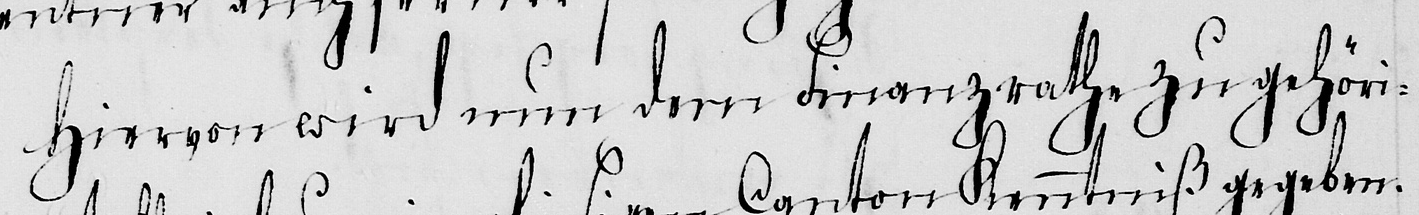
Hiervon wird nun dem Finanzrathe zu gehöri¬
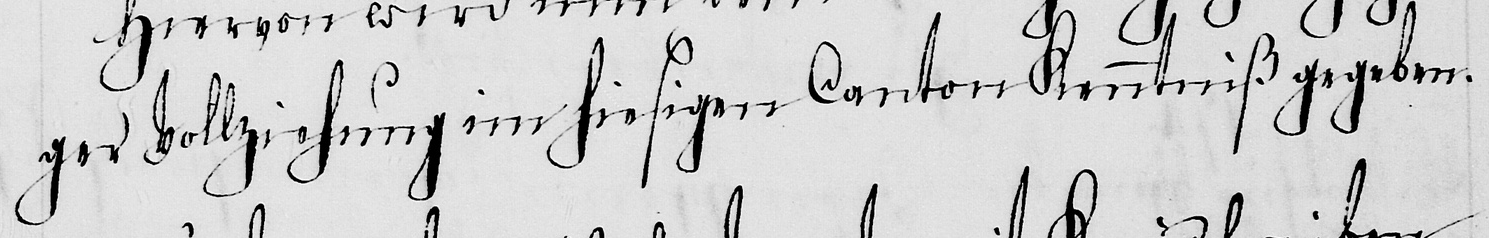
ger Vollziehung in hiesigen Canton Kenntniß gegeben.
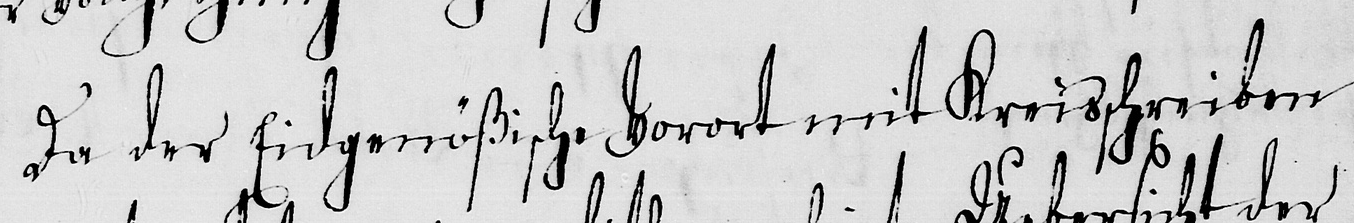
Da der Eidgenößische Vorort mit Kreisschreiben
